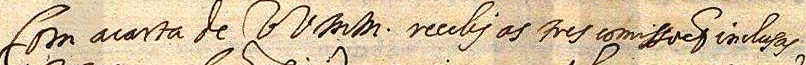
Com a carta de VV MM. recebj as tres comissoẽs inclusas
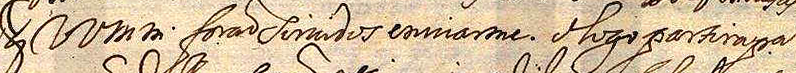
q̄ VV MM foraõ Siruidos enuiarme. e logo partira p.a
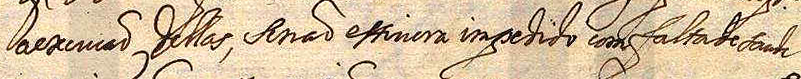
a execuçaõ dellas, se não estiuera impedido com falta de saude
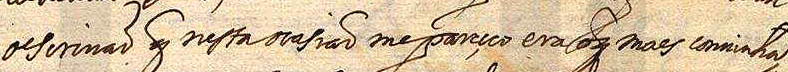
o escriuão q̄ nesta ocasiaõ me pareceo era o q̄ maes conuinha,
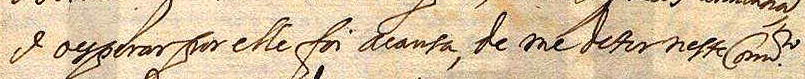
e o esperar por elle foi a causa, de me deter neste Conu.to
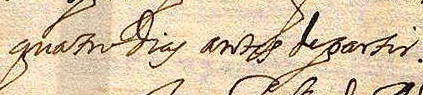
quatro dias antes de partir.
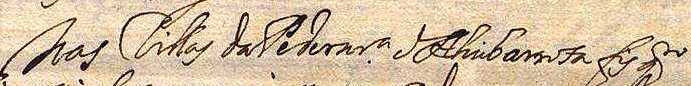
nas Villas da Pedernr.a e Aliubarrota fis qto
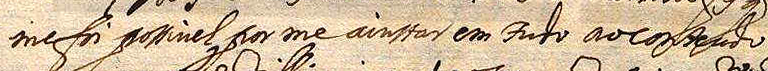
me foi possiuel por me aiustar em tudo ao conteudo
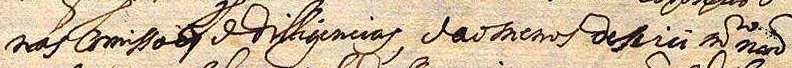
nas comissoẽs, e dilligencias, e ao menos deseiei mto naõ
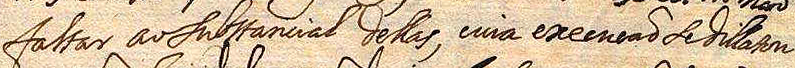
faltar ao substancial dellas, cuia execuçaõ se dillatou
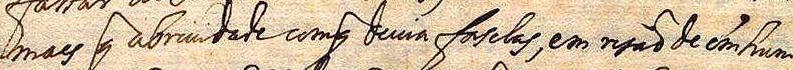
maes q̄ a breuidade com q̄ deuia faselas, em resaõ de em hum
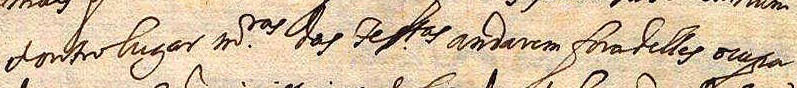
e outro lugar m.tas das test.as andarem fora delles ocupa
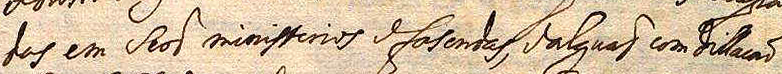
das em seos ministerios e fasendas, e alguas̄ com dillaçaõ
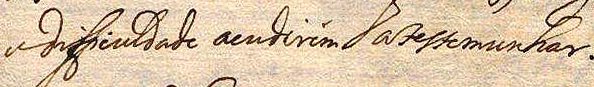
e difficuldade acudirem a testemunhar.
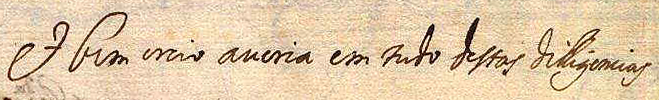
& bem creio aueria em tudo destas dilligencias
